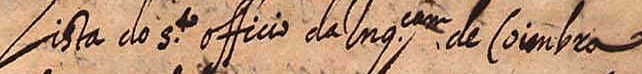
Lista do s.to officio da Inq.cam de Coimbra
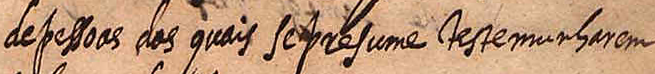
de pessoas das quais se presume testemunharem
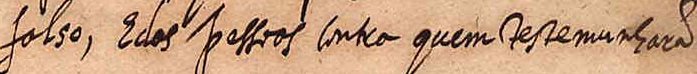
falso, E das pessoas contra quem testemunharão
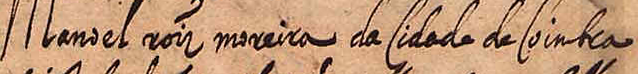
Manoel roīz moreira da Cidade de Coimbra
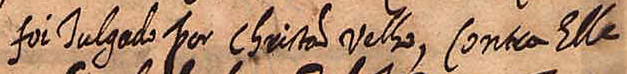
foi Iulgado por Christaõ Velho, Contra Elle
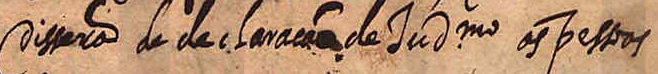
disserão da declaracão de Iud.mo as pessoas
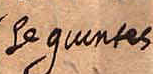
seguintes
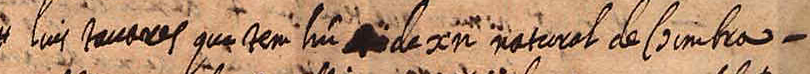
Luis tauares que tem hū _ de xn natural de Coimbra
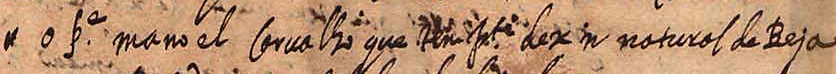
o p.e manoel Carualho que tem p.te de xn natural de Beja
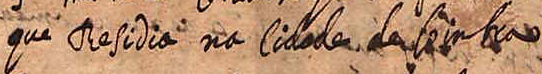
que Residia na Cidade de Coimbra
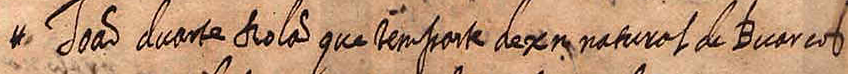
Ioão duarte Rolaõ que tem parte de xn natural de Buarcos
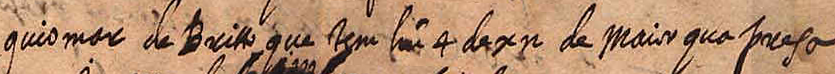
guiomar de Britto que tem hū 4 de xn de Maiorqua presa
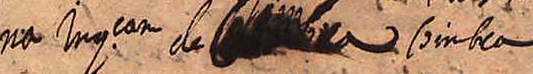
na Inq.cam de _ Coimbra
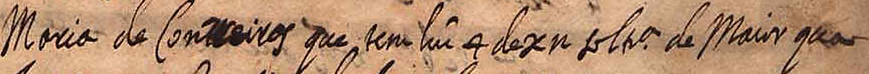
Maria de Contreiras que tem hū 4 de xn soltr.a de Maiorqua
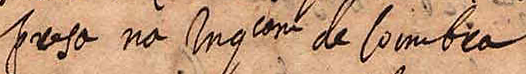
presa na Inqcam de Coimbra
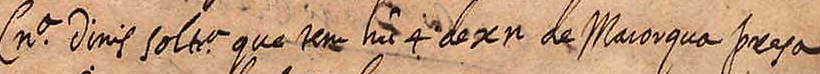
Cn.a dinis soltr.a que tem hū 4 de xn de Maiorqua presa
